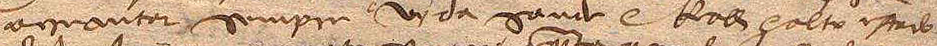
acrecentar sempre vyda saude e Reall e alto estado
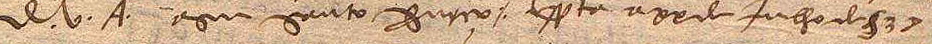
de .V. A. a seu santo ꞩuyço ./. esp̄ta a xx de Julho de 538
